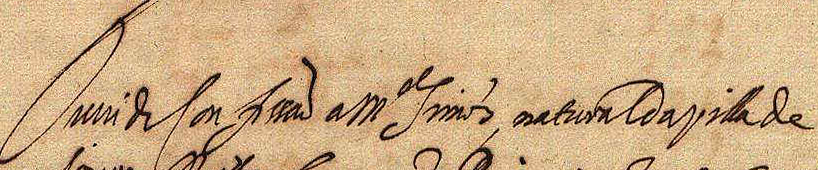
Ouuida Confissão a mel simos̄, natural da villa de
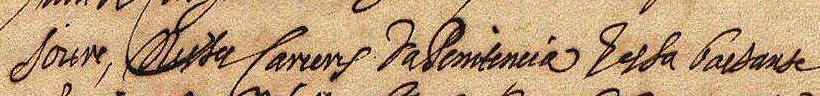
Soure, nestes Carceres da Penitencia E esta bastante
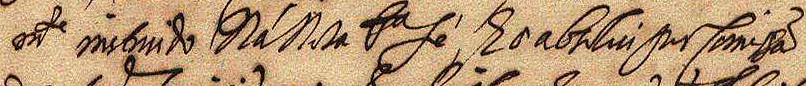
mte instruido na nosa Sta. fé, E o absolui por Comissaõ
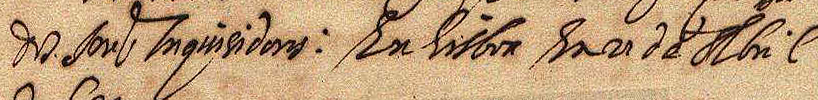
dos sors̄ Inquisidores: En lisboa En 21 de Abril
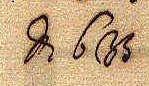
de 633
